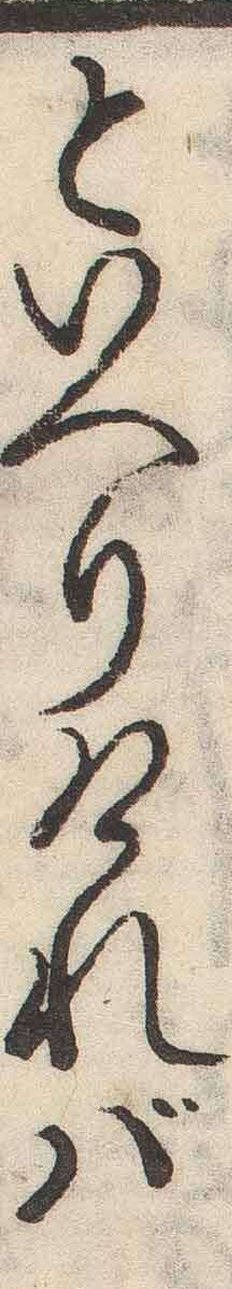といへりければ
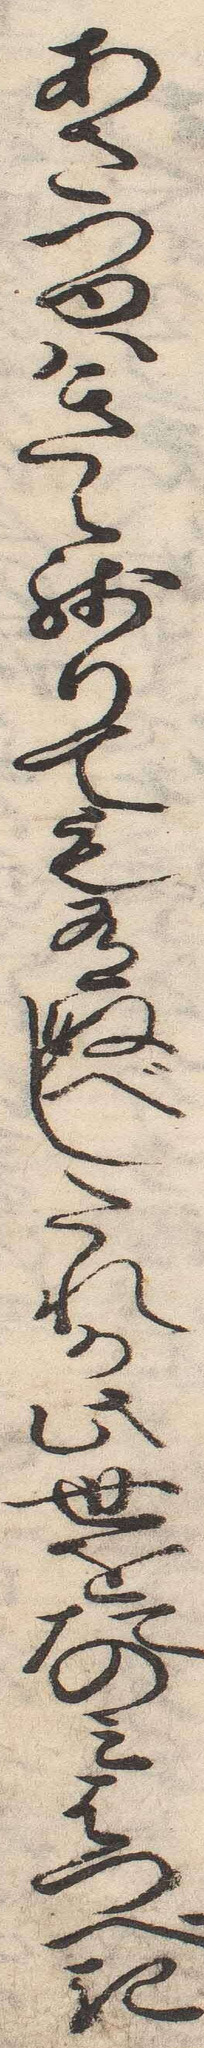あさつゆはきえ残りても有ぬべしたれか此世をたのみはつべき
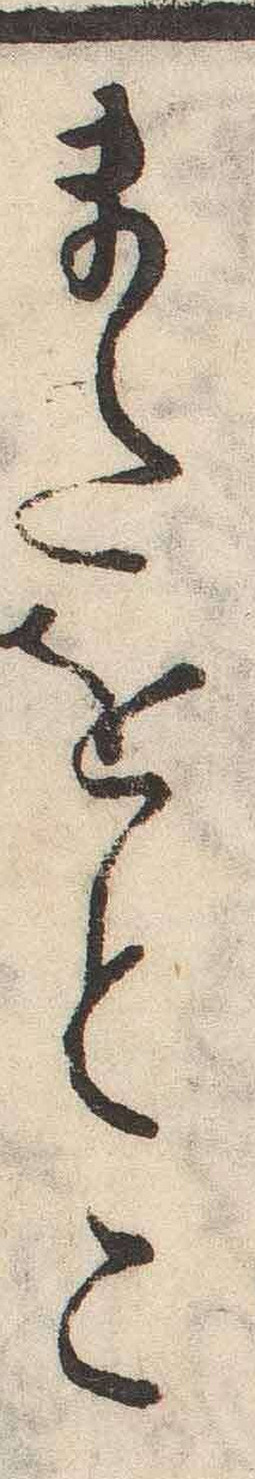またをとこ
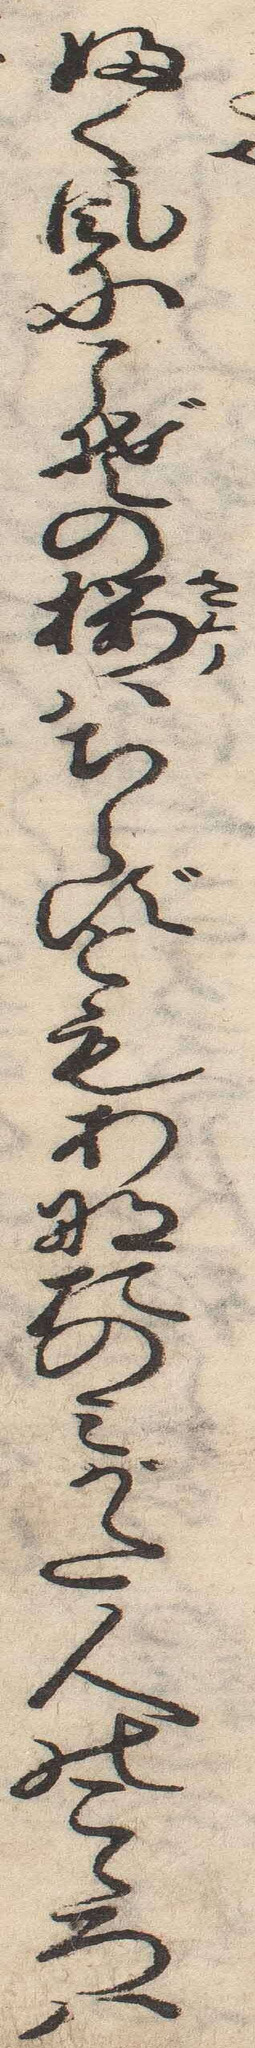ふく風にこぞの桜はちらずともあなたのみがた人のこゝろは
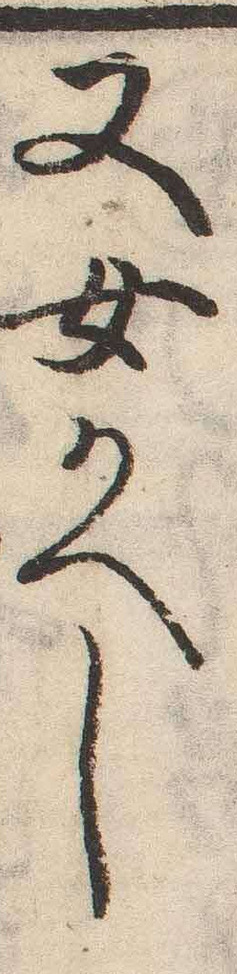又女かへし
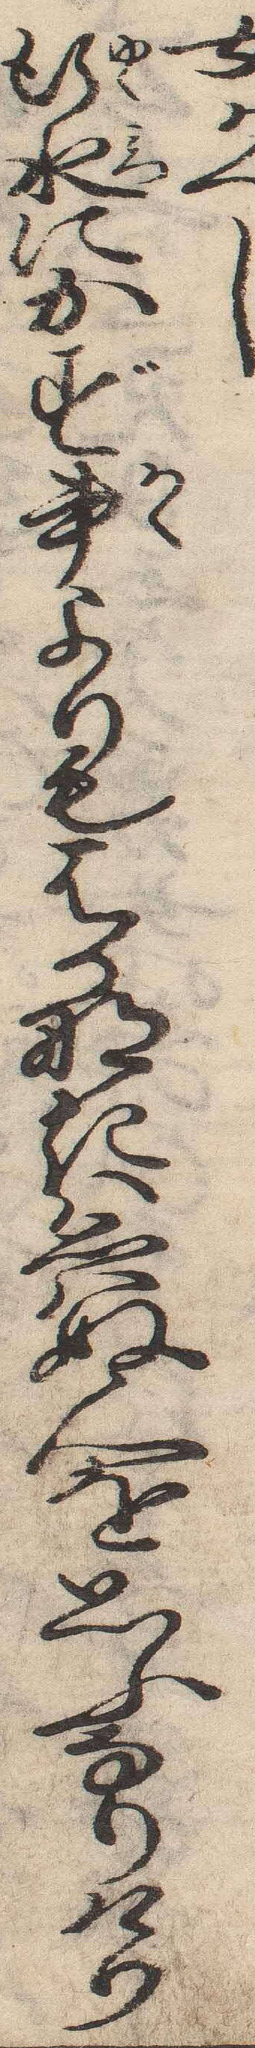行水にかず書よりもはかなきは思はぬ人を思ふなりけり
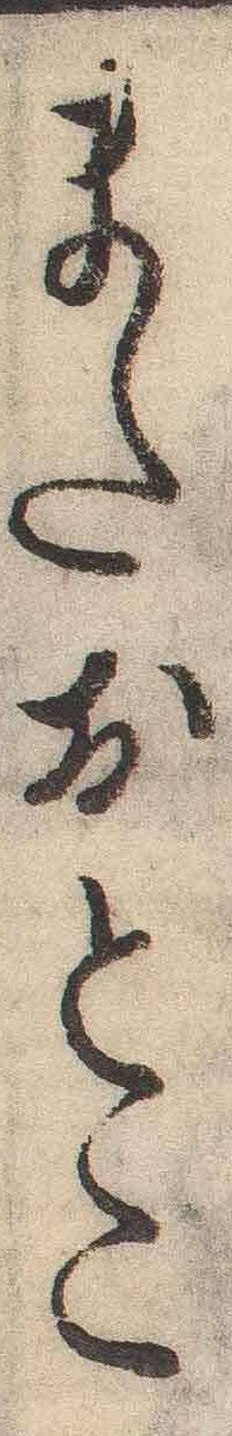またおとこ

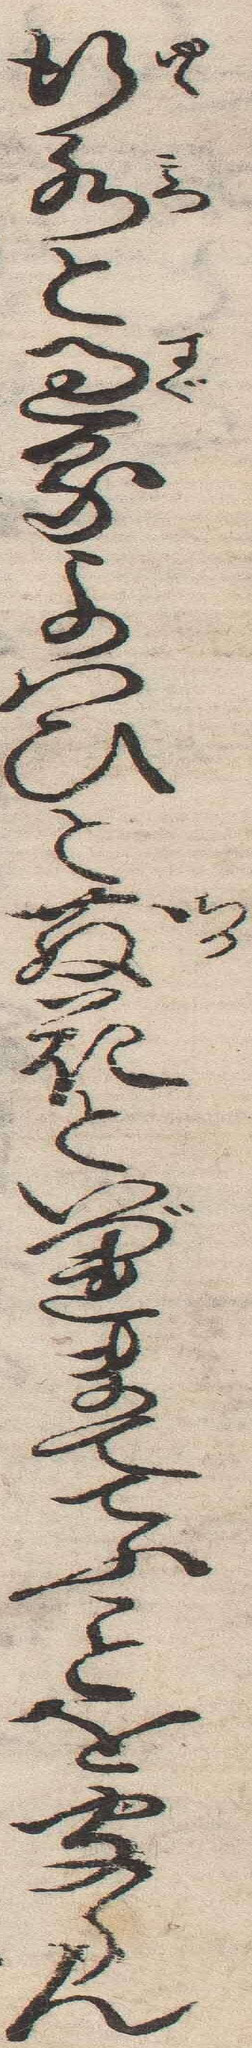行水と過るよはひと散花といづれまててふことを聞らん
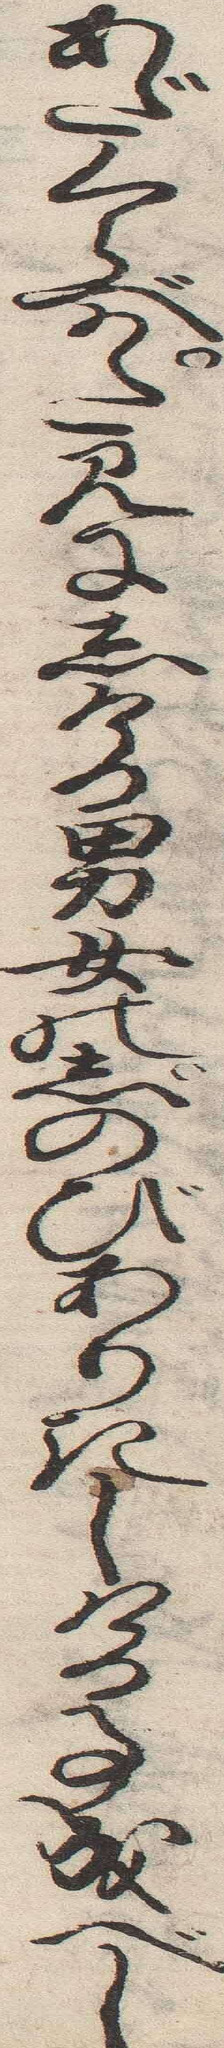あだくらべ。かたみにしける男女の。しのびありきしける事成べし
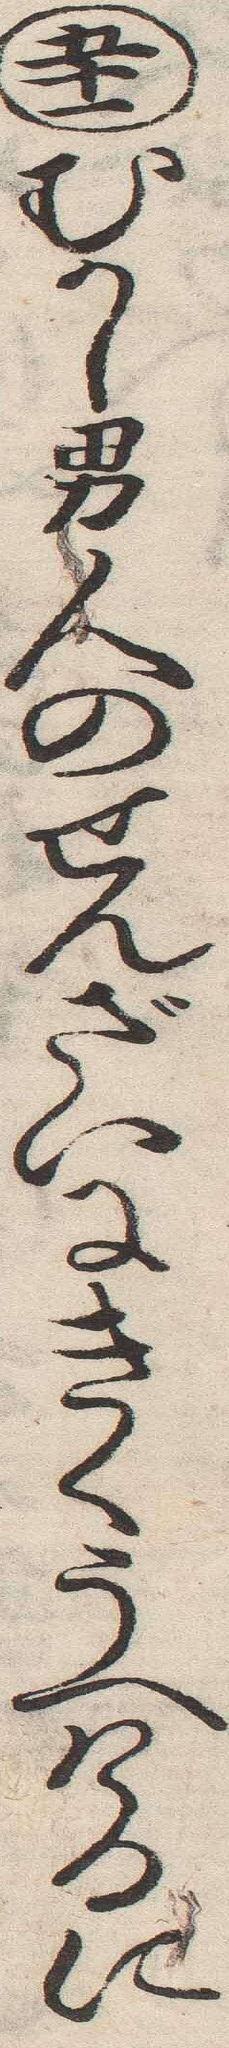五十一むかし男人のせんざいにきくうへけるに
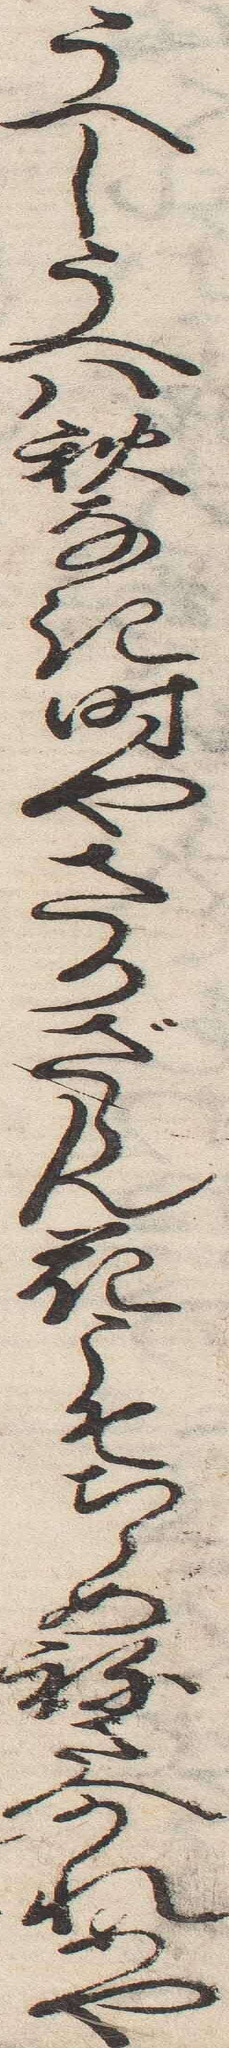うへしうへは秋なき時やさかざらん花こそちらめねさへかれめや
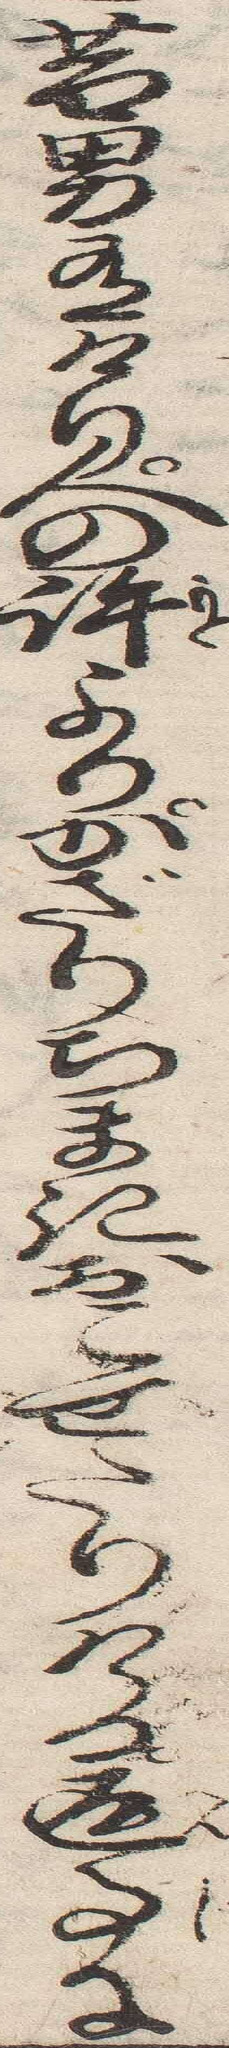五十二昔男有けり。人の許より。かざりちまきおこせたりける。返事に
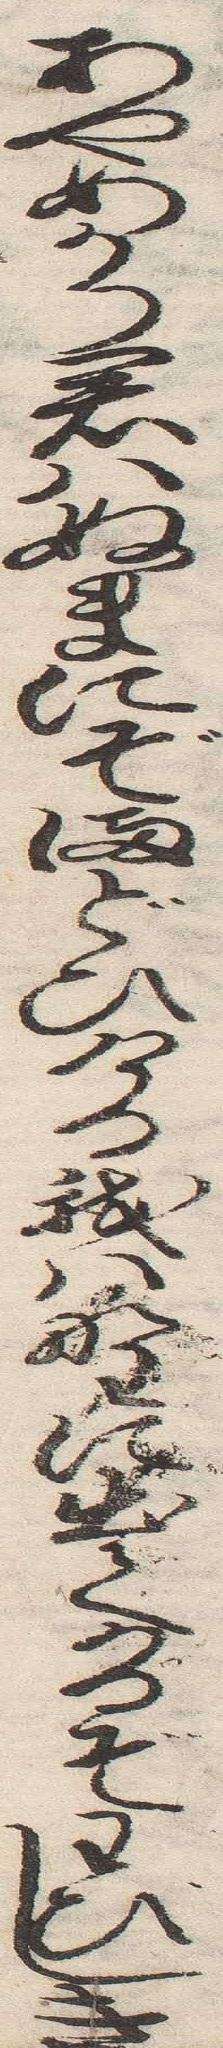あやめかり君はぬまにぞまどひける我は野に出てかるぞわひしき
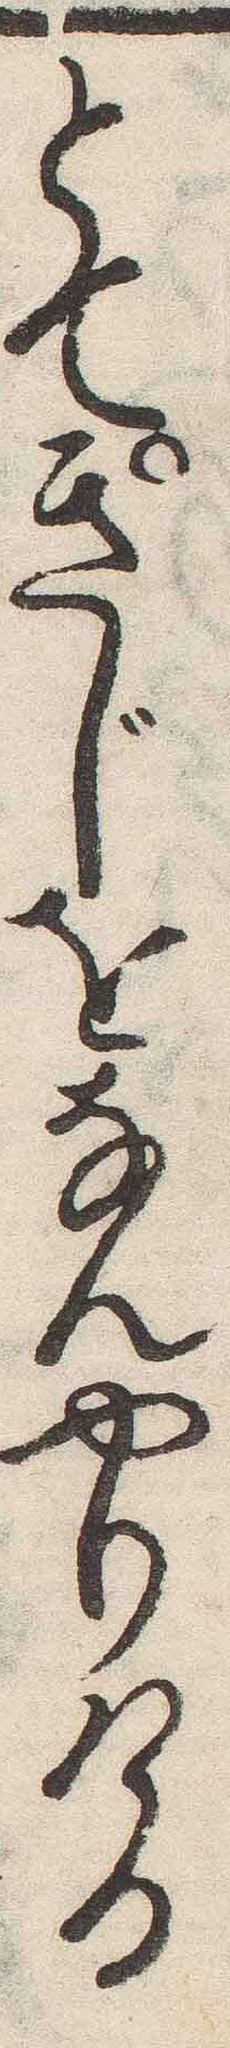とて。きじをなんやりける
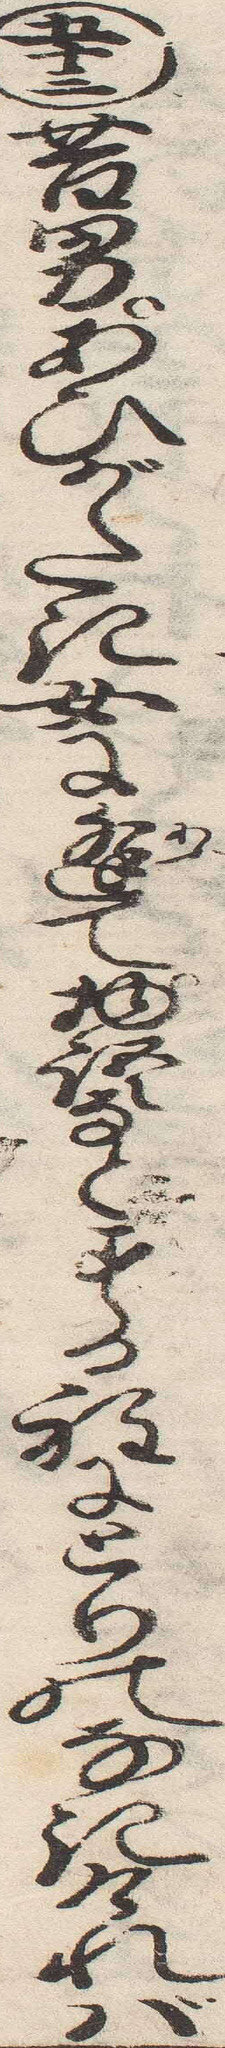五十三昔男。あひがたき女に逢て。物語なとする程にとりのなきければ
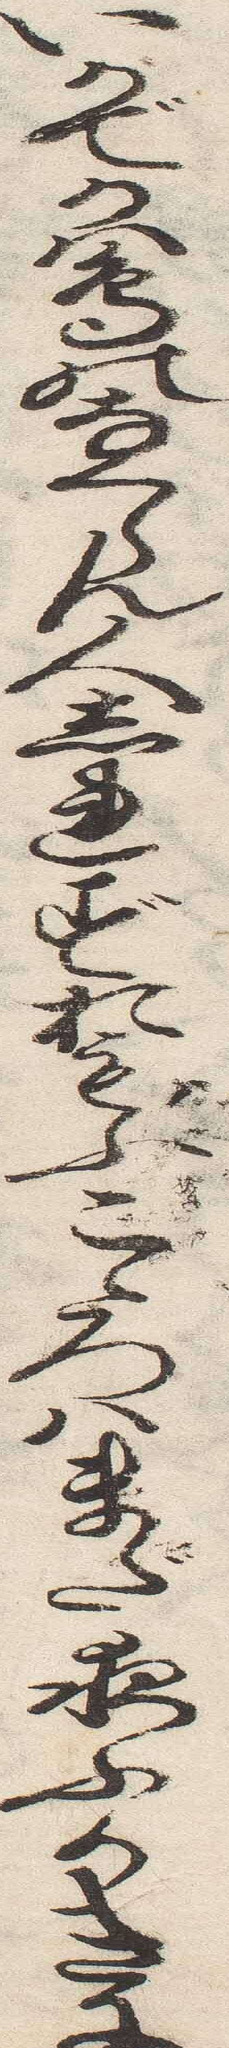いかでかは鳥のなくらん人しれずおもふこゝろはまだ夜ふかきに
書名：伊勢物語
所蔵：東京学芸大学附属図書館 国文学研究資料館
